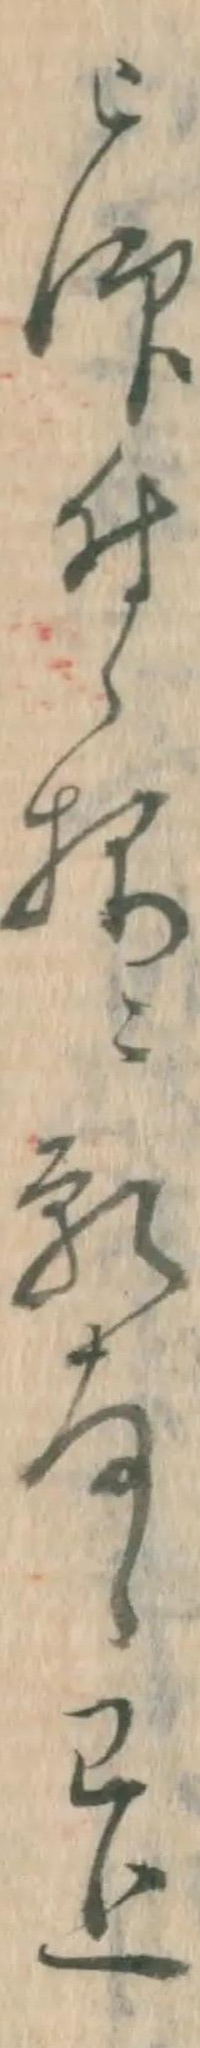被仰付候様ニ願なり已上
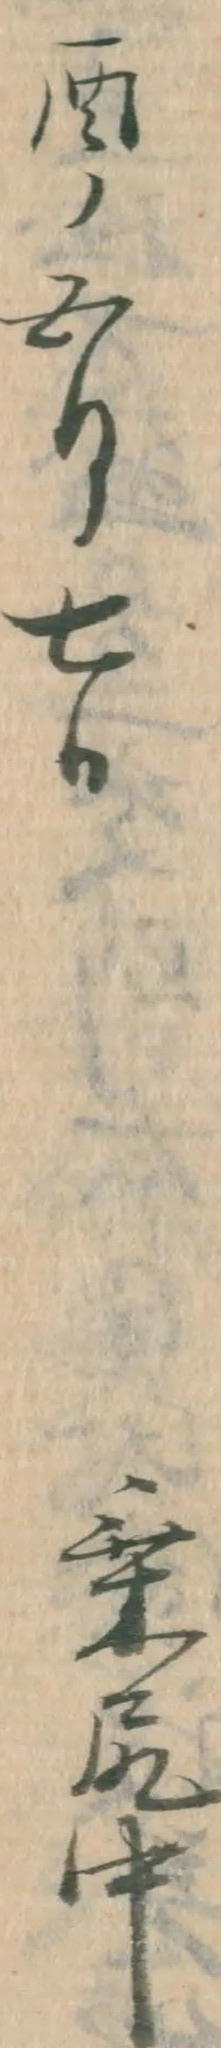酉ノ五月七日乗尻中
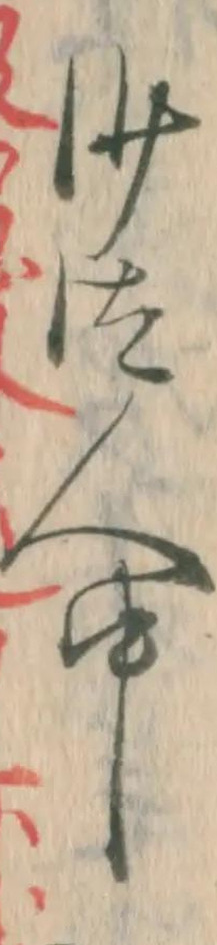沙汰人中
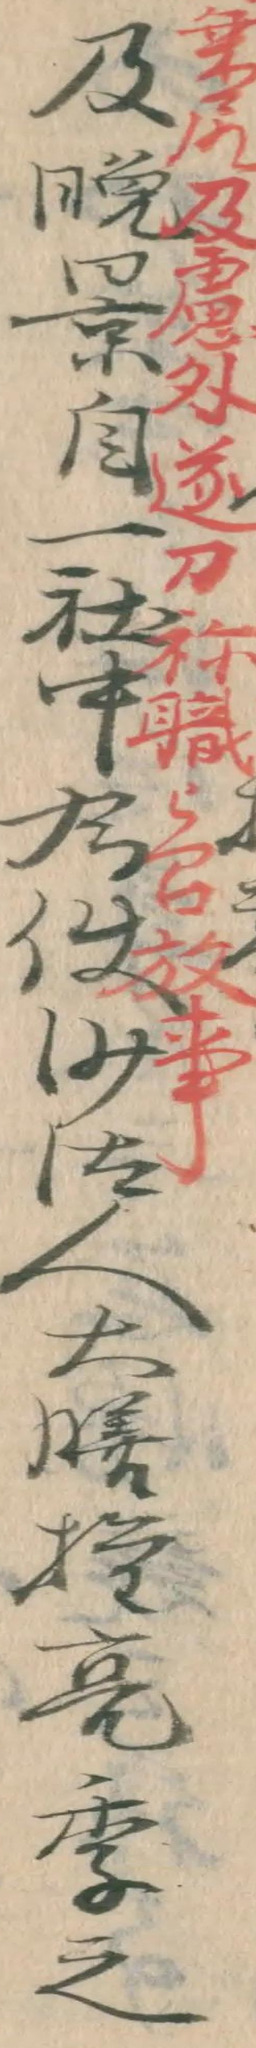及晩景自一社中為使沙汰人大膳権亮季之
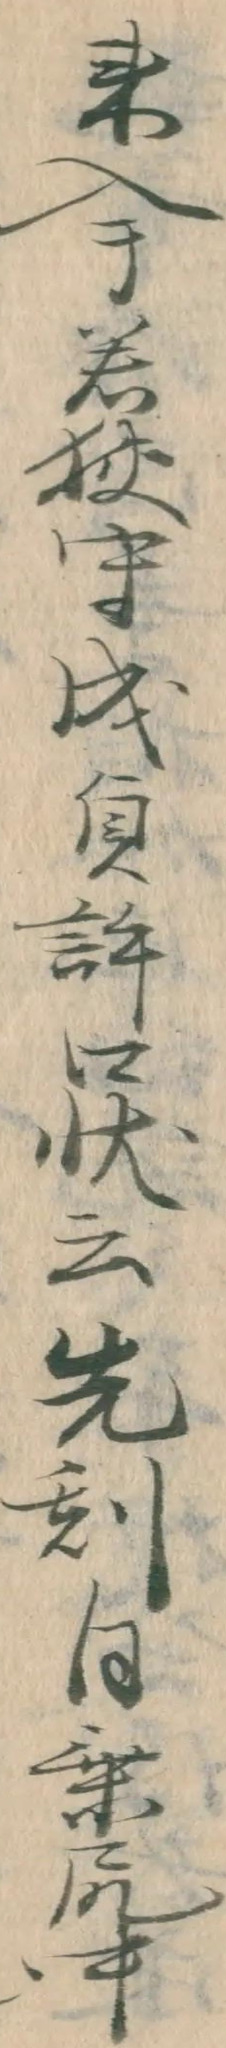来入于若狭守成貞許口状云先刻自乗尻中
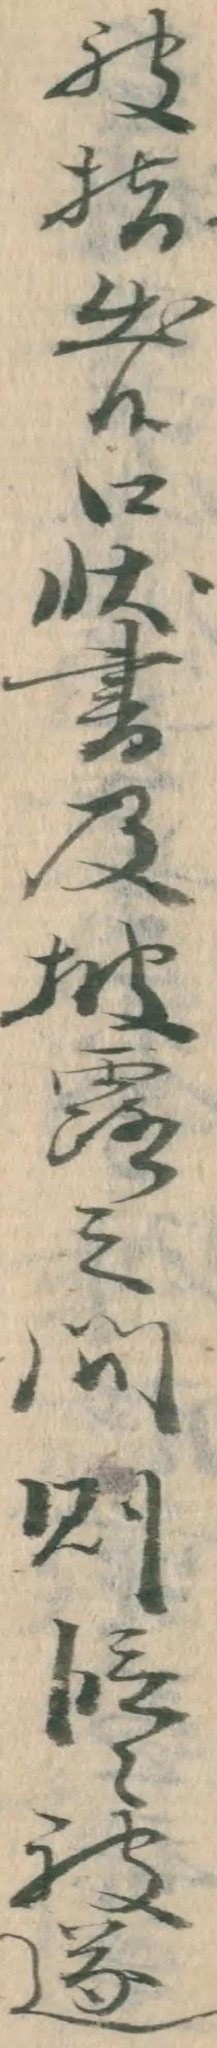被指出候口状書及披露之間則段々被遂
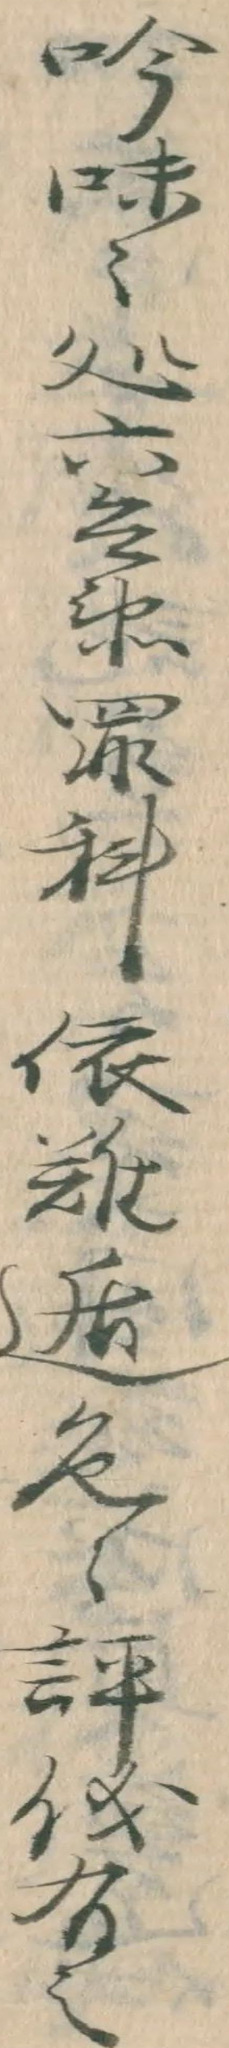吟味之処六兵衛罪科依難遁色々評儀有之
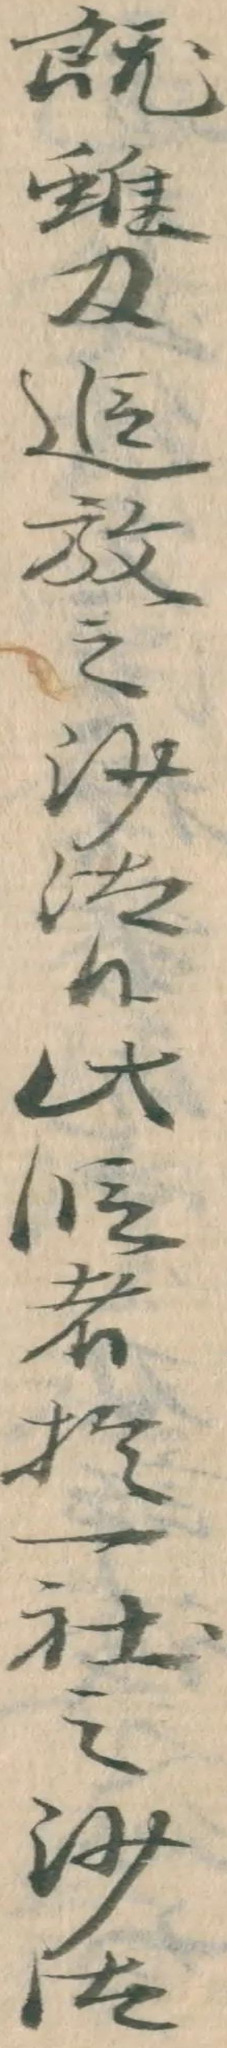既雖及追放之沙汰候此段者於一社之沙汰
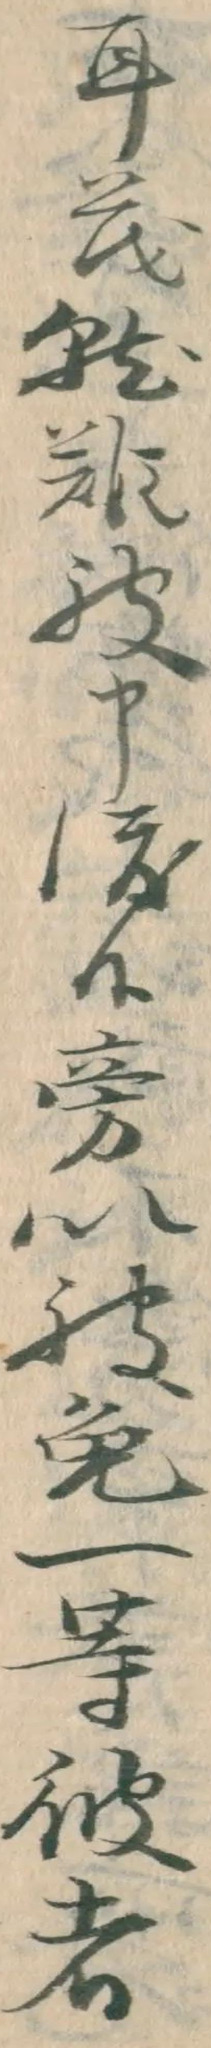耳茂就難被申渡候旁以被免一等彼者
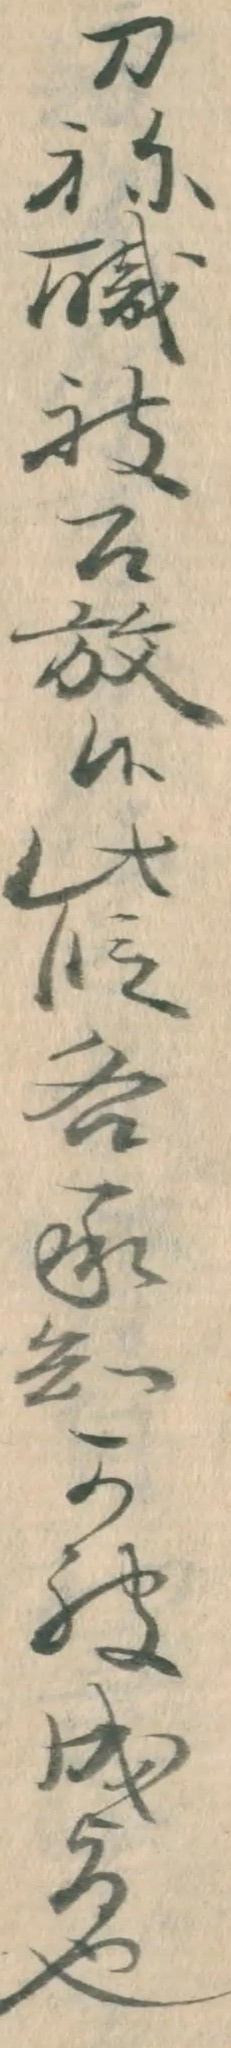刀祢職被召放候此段各承知可被成旨也
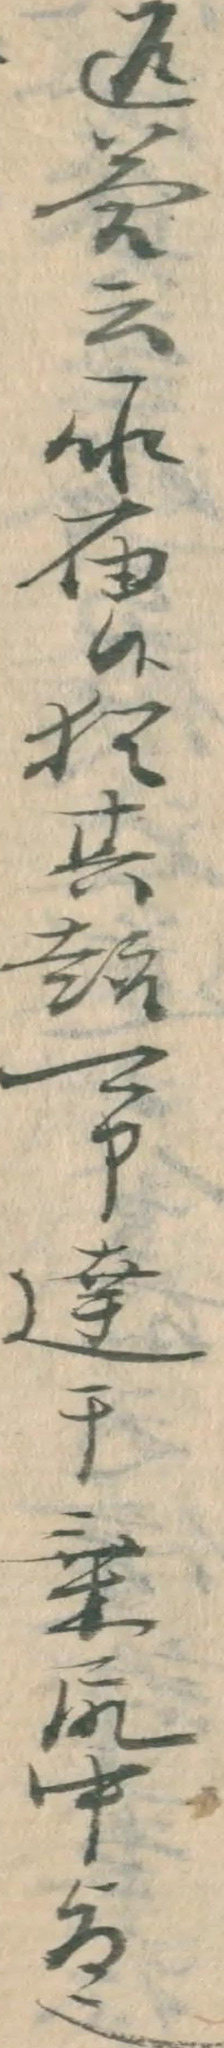返答云承届候猶其趣可申達于乗尻中旨也
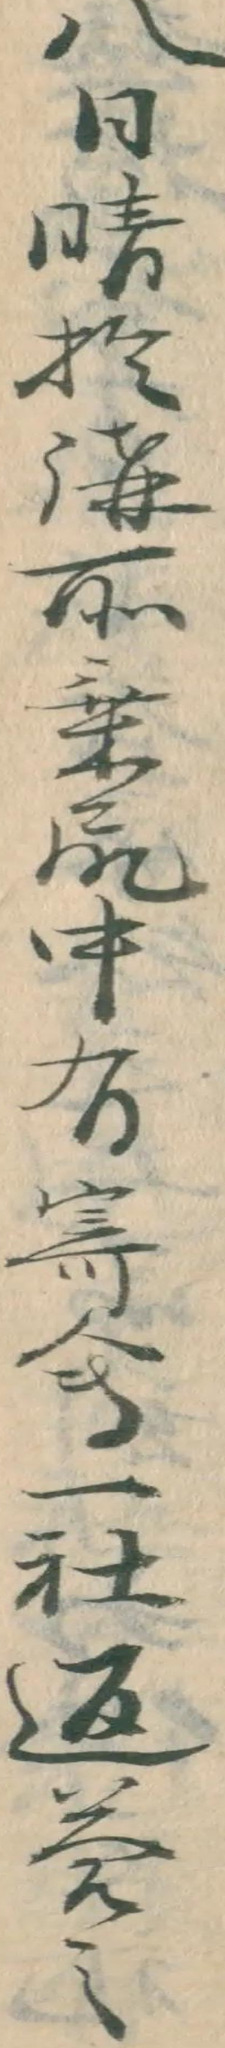八日晴於溝所乗尻中有寄会一社返答之

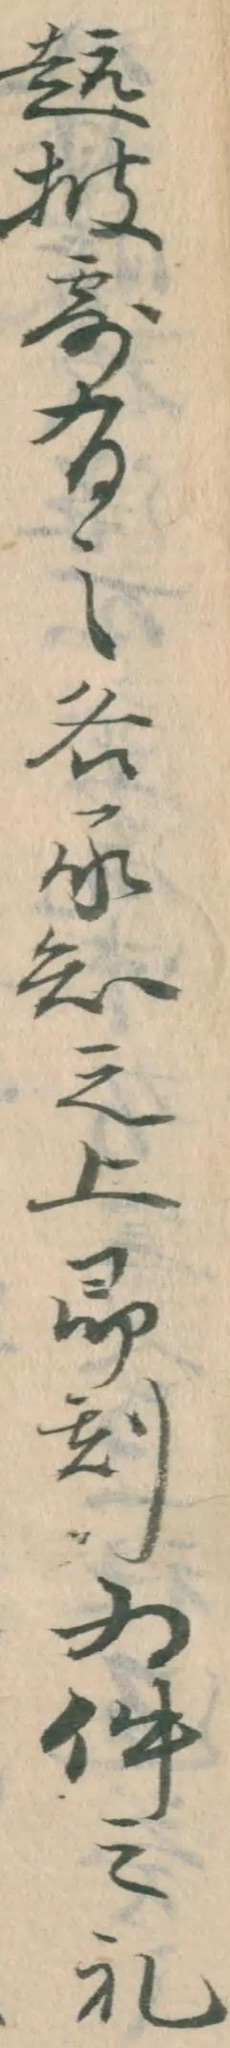趣披露有之各承知之上即刻為件之礼
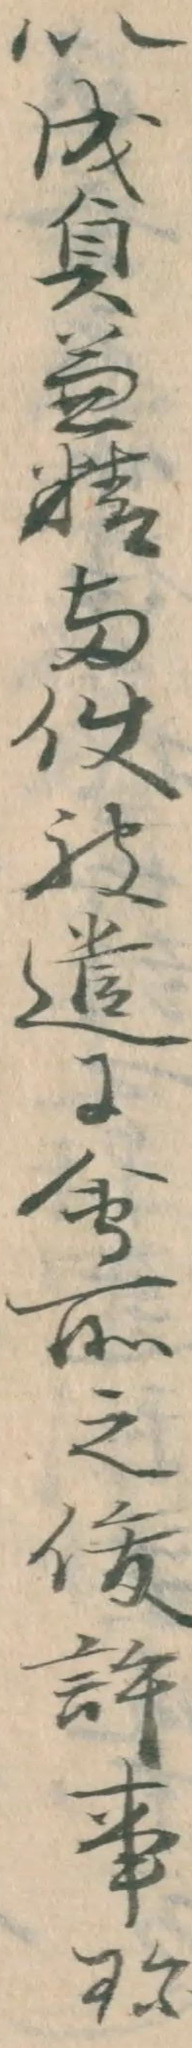以成貞兼精両使被遣に会所之俊許事珍
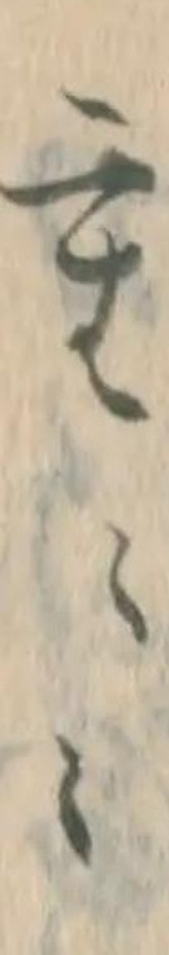重々々
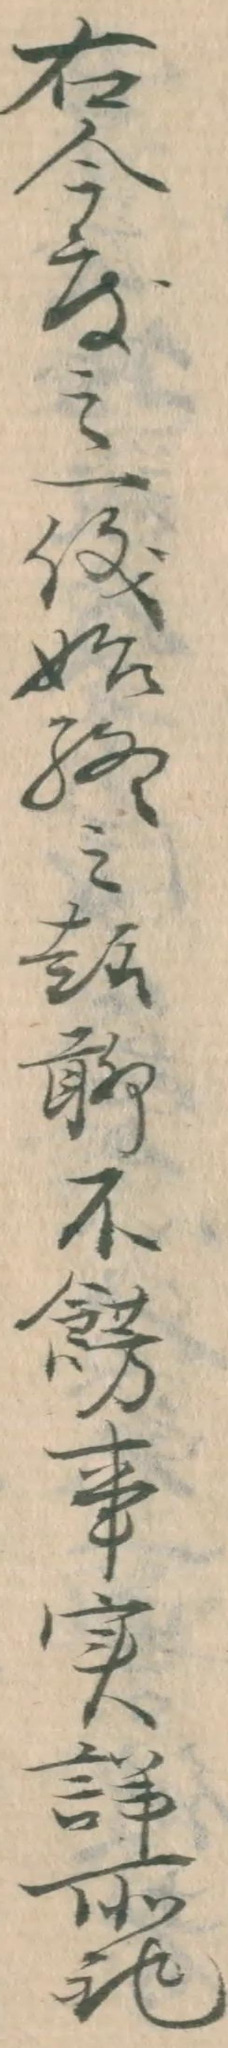右今度之一儀始終之趣聊不餝事実詳所記
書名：賀茂社記録. 第10冊
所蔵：国立国会図書館 National Diet Library, JAPAN
